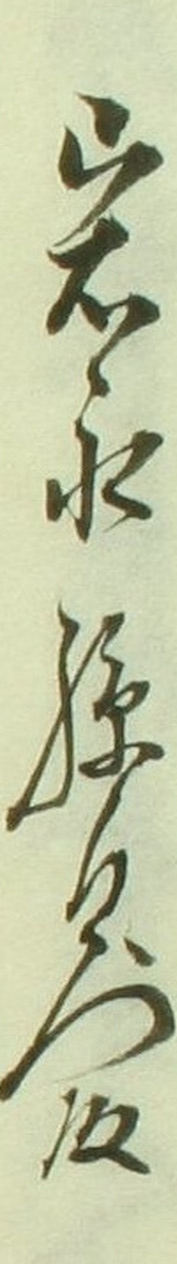岩永孫左衛門殿
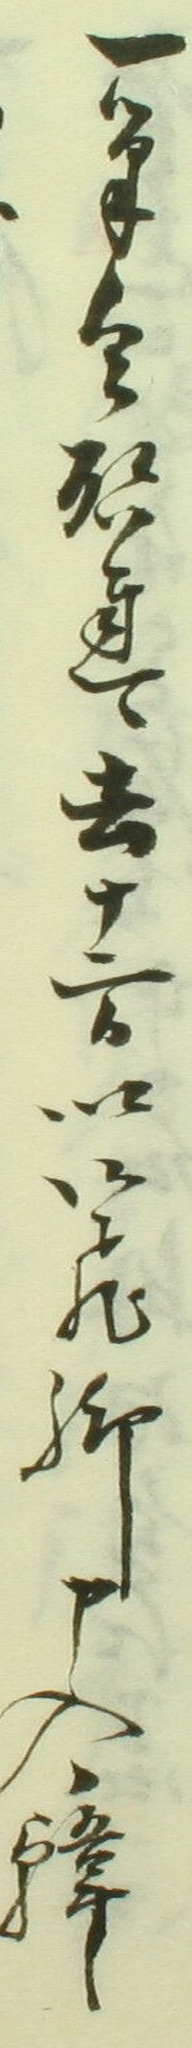一筆令啓達候去十二日以御飛脚申入候韓
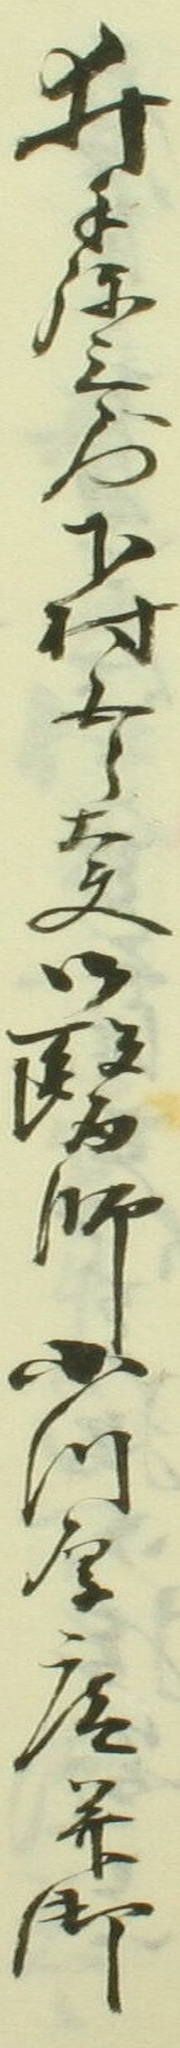井手弥三右衛門下村五郎大夫御医師小川厚庵并御
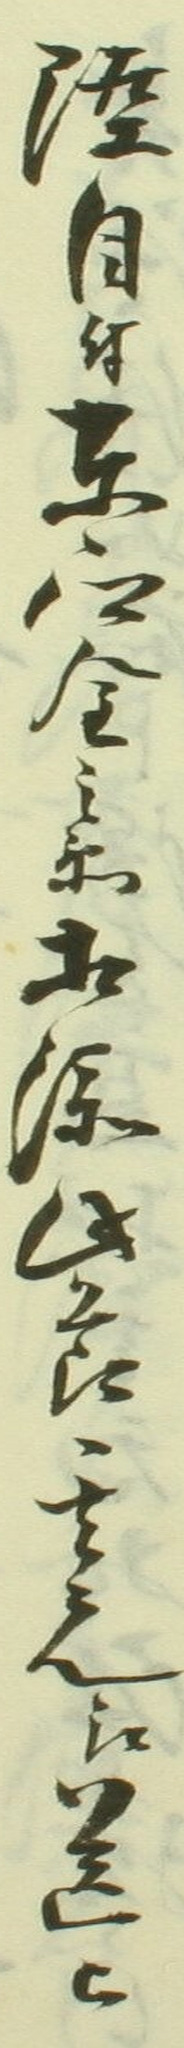陸目付東郷金兵衛相添此節其元江送被
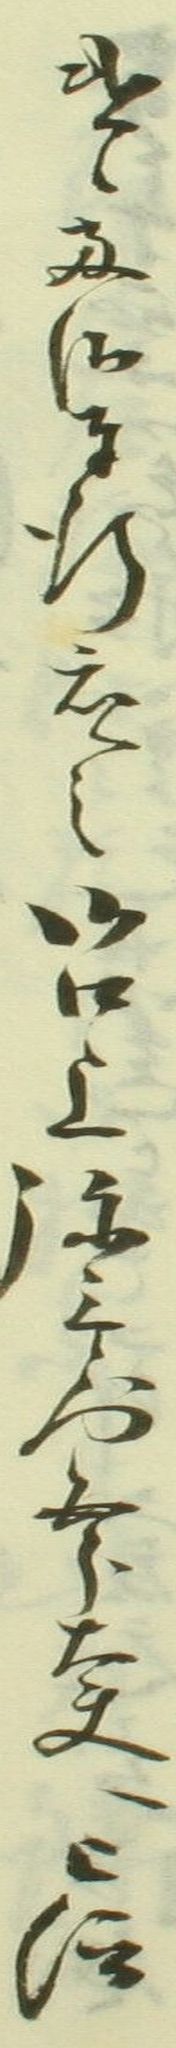遣候両御奉行衆へ之御口上弥三右衛門五郎大夫へ被仰
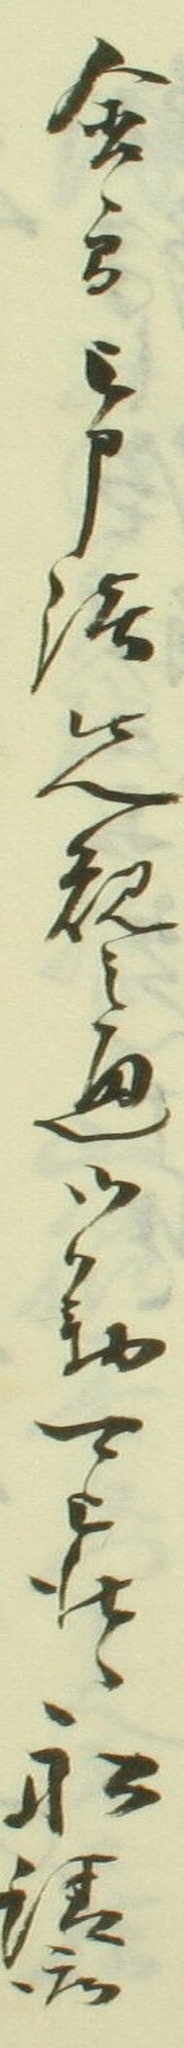含候間被申談先規之通御勤可被仕候船請取
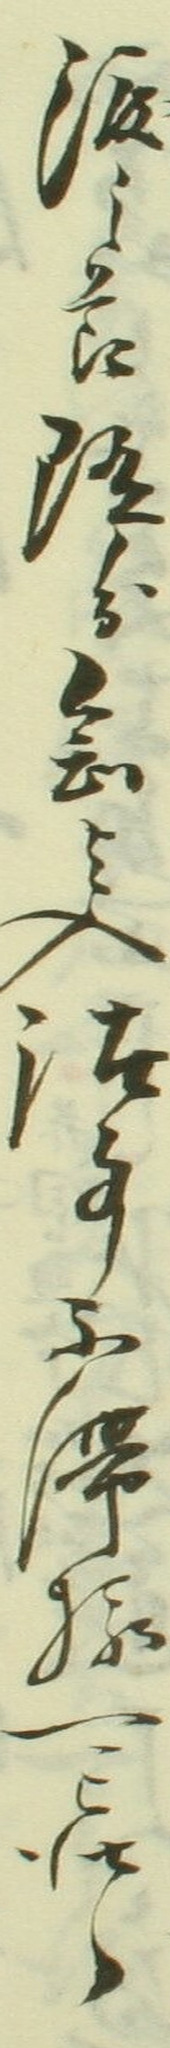渡之節随分念を入諸事不滞様可被仕候
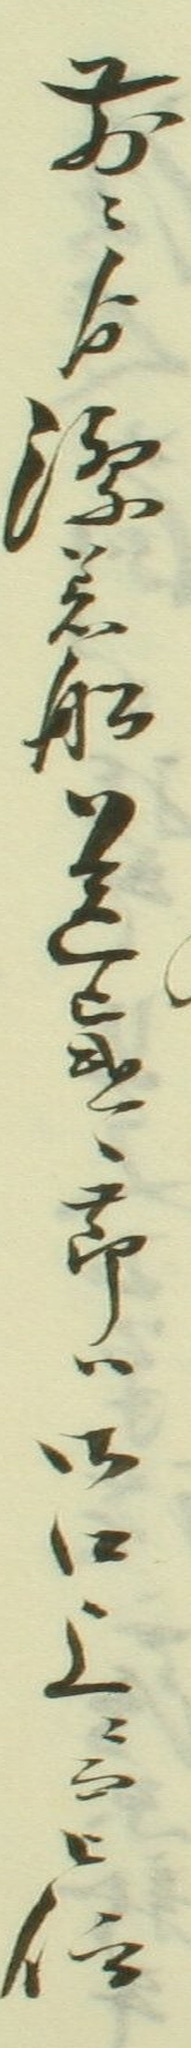前々ゟ漂着船送被遣候節ハ御口上ニ而被仰
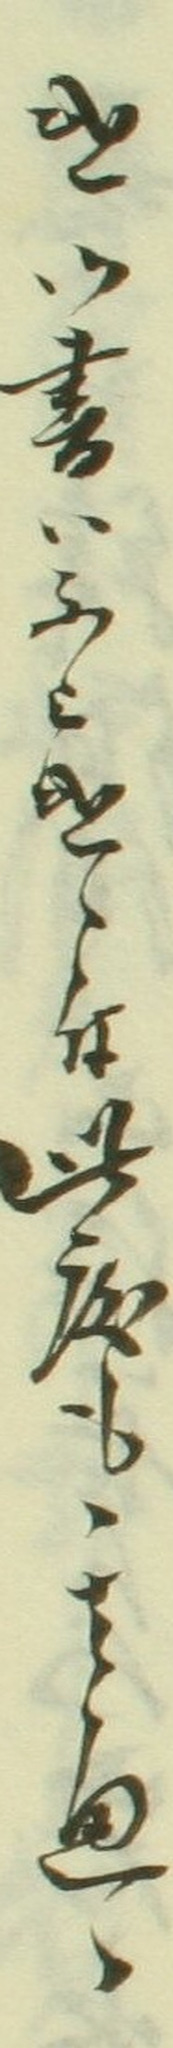遣御書ハ不被遣候ニ付此度も其通候
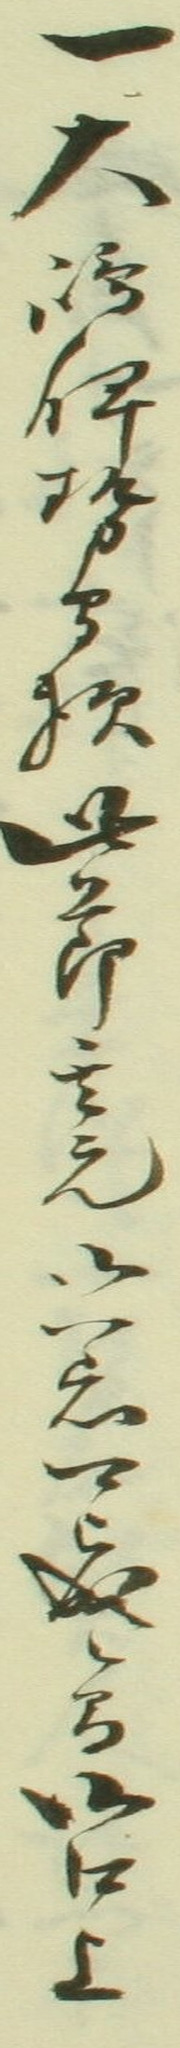一大嶋伊勢守様此節其元御着可被成候間御口上
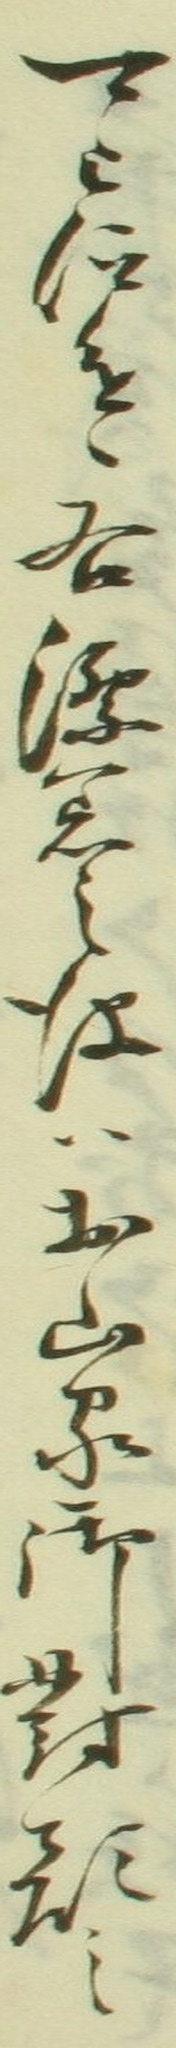可被仰進候右漂着之儀ハ於山家御対顔之
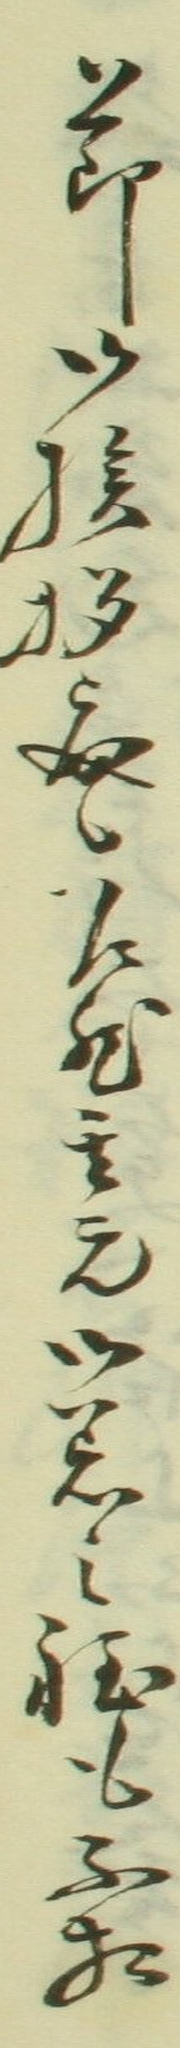節御挨拶被成候乍然其元御着之程も不相

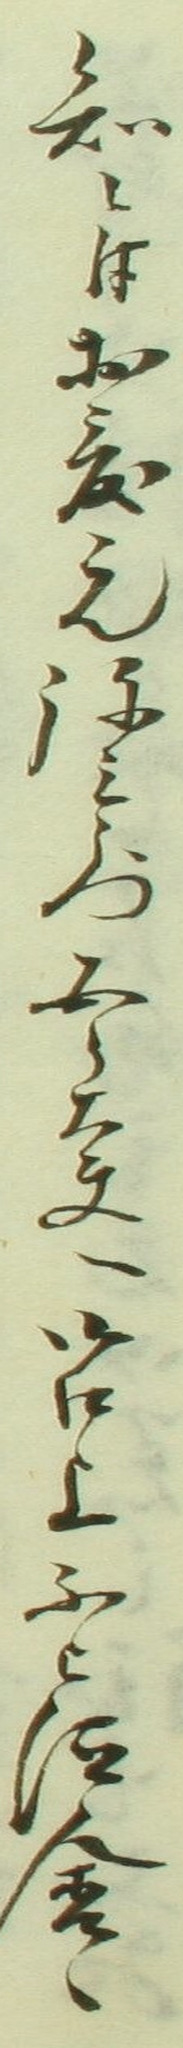知ニ付於爰元弥三右衛門五郎大夫へ御口上不被仰含候
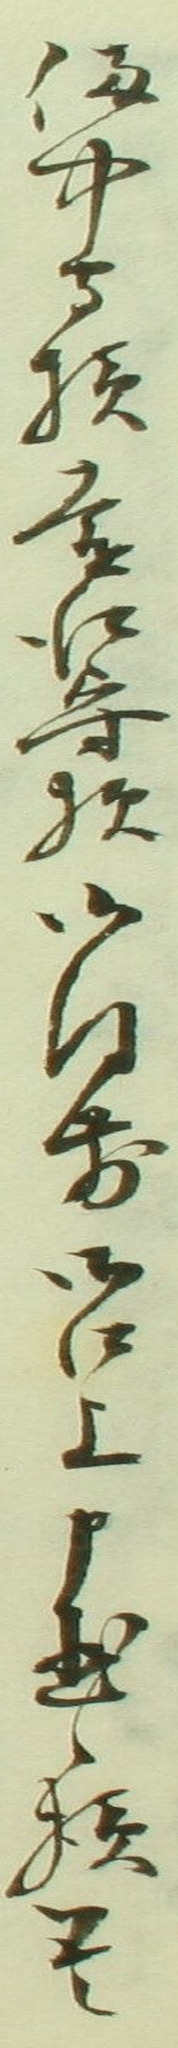備中守様遠江守様御同前御口上申述候様貴
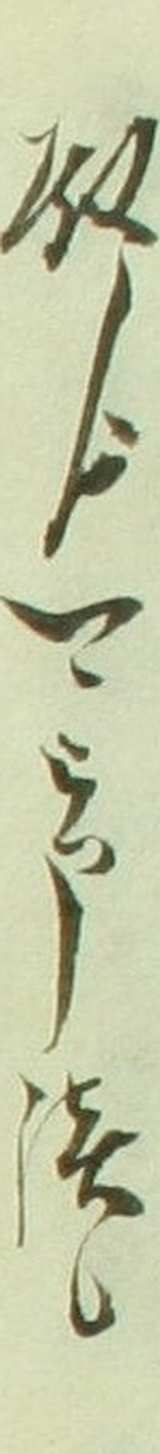殿ゟ可被申談候
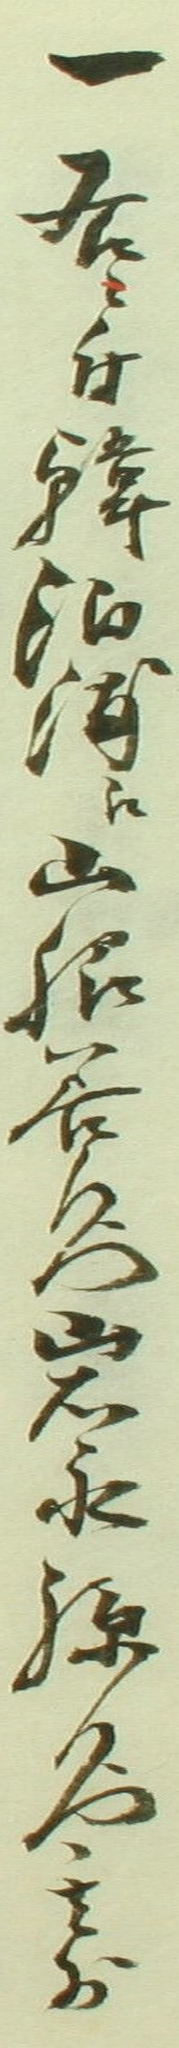一右ニ付韓泊浦江山脇善左衛門岩永孫左衛門其外
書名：異国船漂着記
